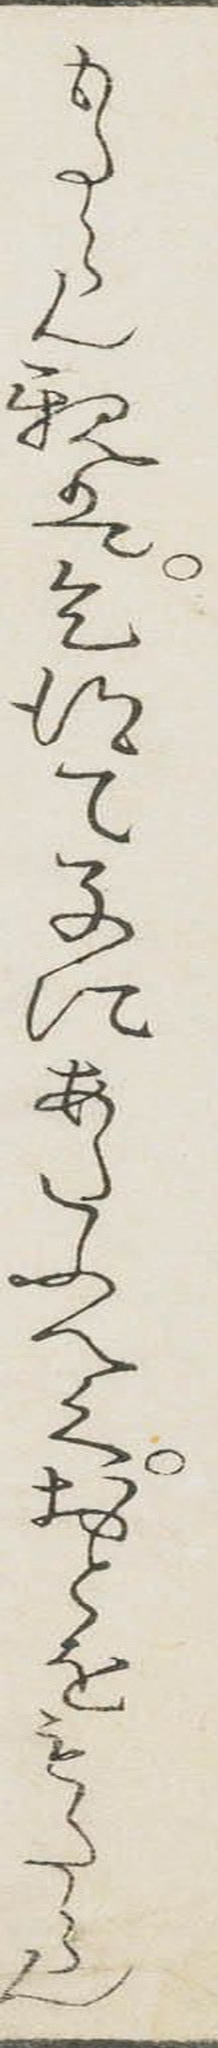もたらん親は。乞得て子にあたふへく。おとをもたらん
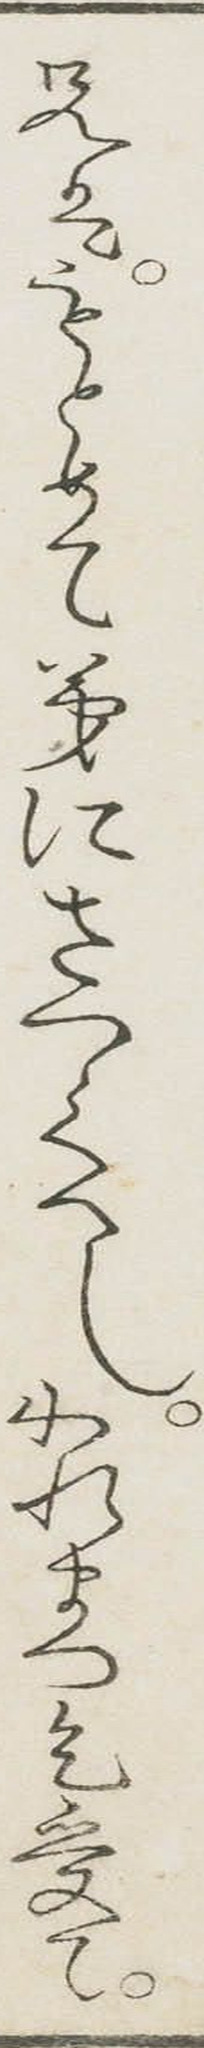兄は。もとめて弟にさつくへし。われまつ乞受て。
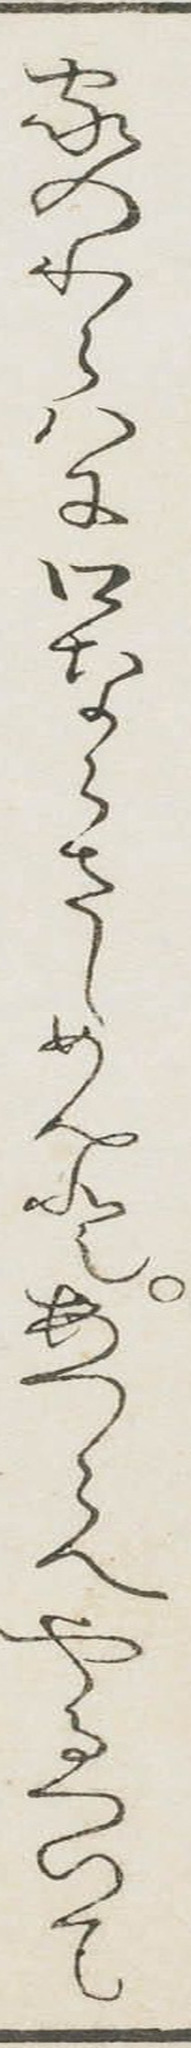家のわらはに口ならさしめんと。あつらへやるついて
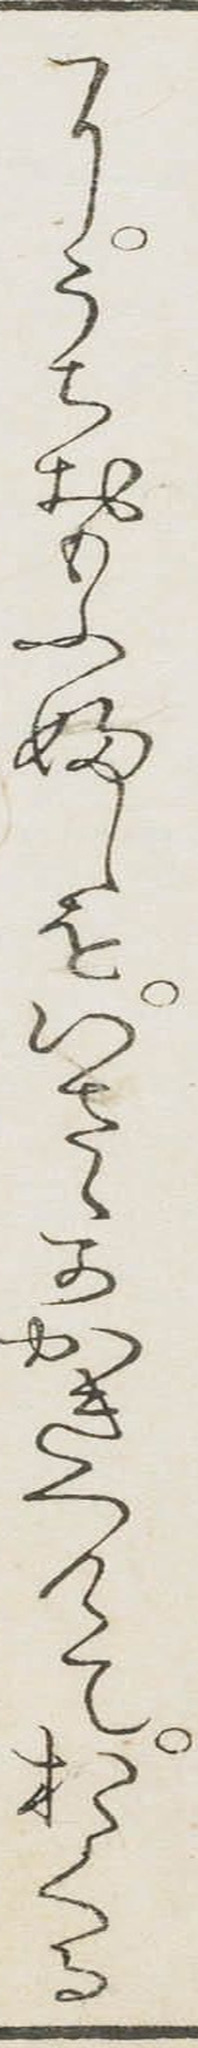に。うちおもふふしを。いさゝかかきつけておくる
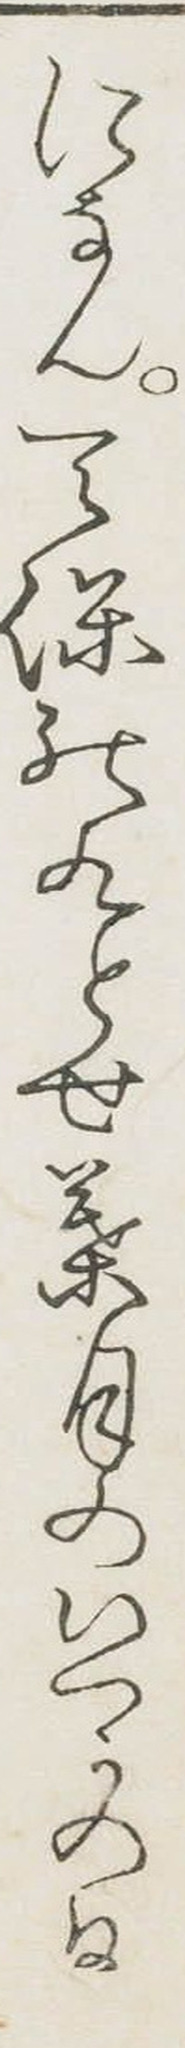になん。天保の九とせ葉月のいつかの日
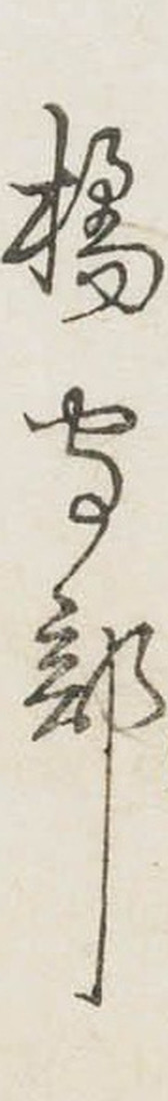橘守部
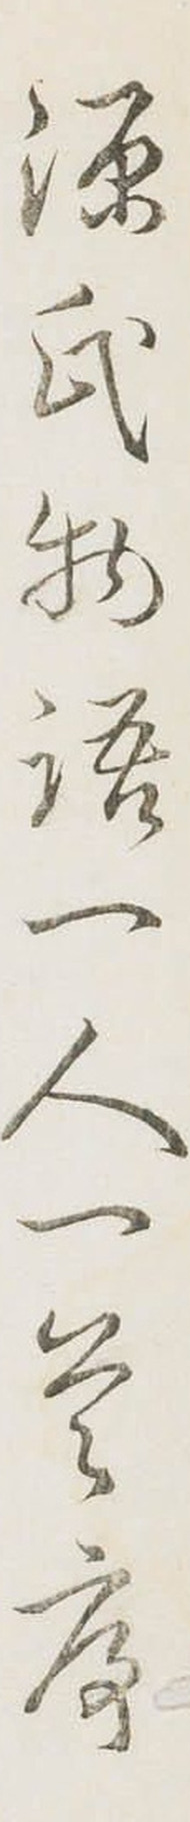源氏物語一人一首序
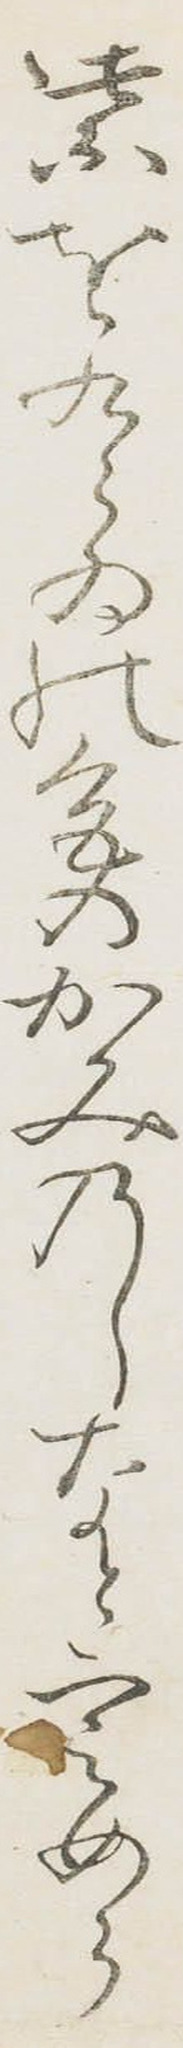紫をくらゐの色のかみのしなと定めら
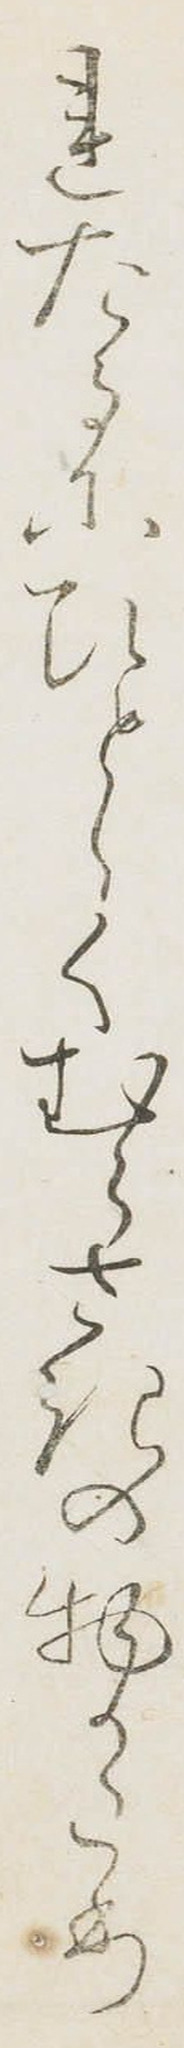れたるにひとしくむらさきの物かたり
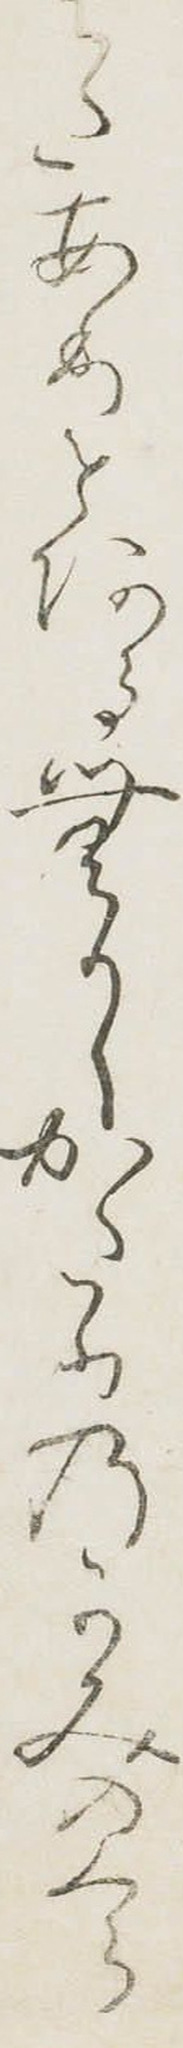はたありとあるむかしかたりのかみのくら
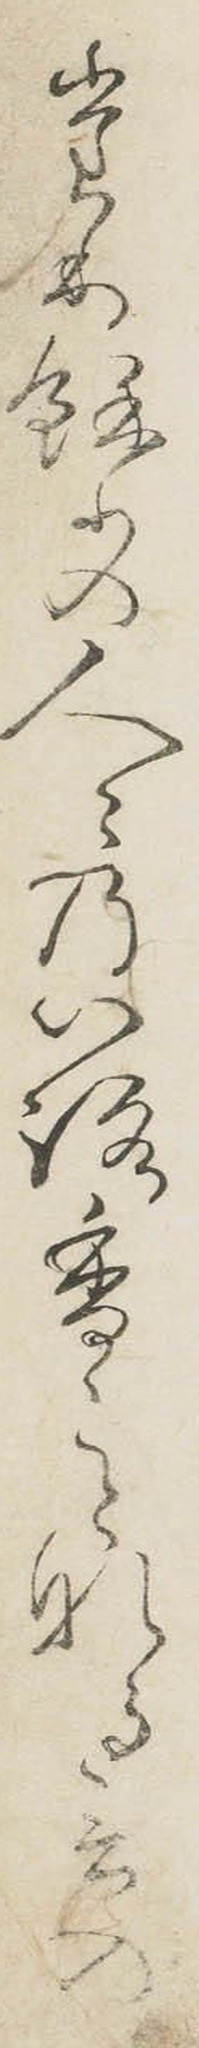たり余りの人々のいろ香ことなる言の

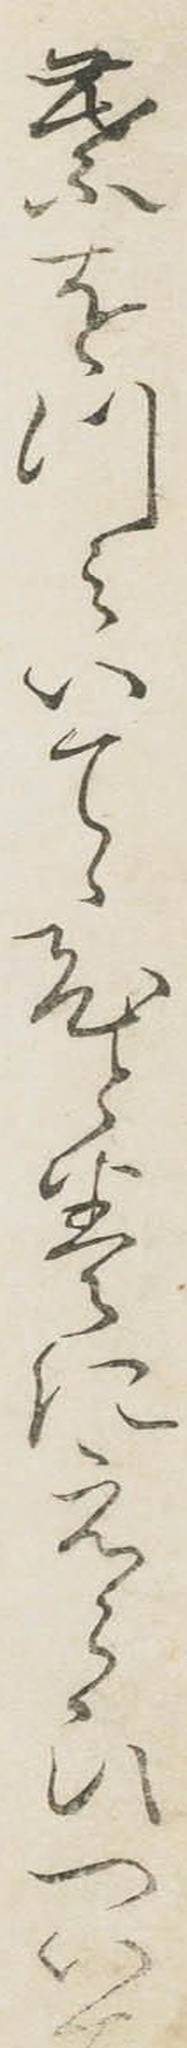葉をつみいてゝひと巻にえらひついてゝ
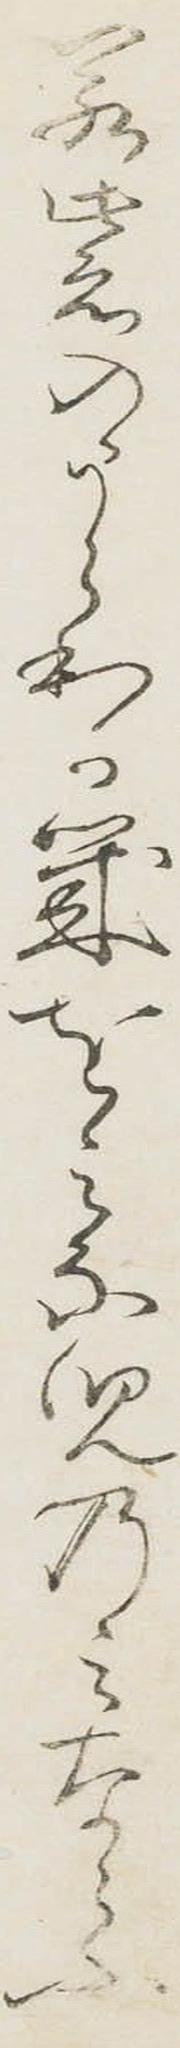若紫のうらわかきをみな児のみならふ
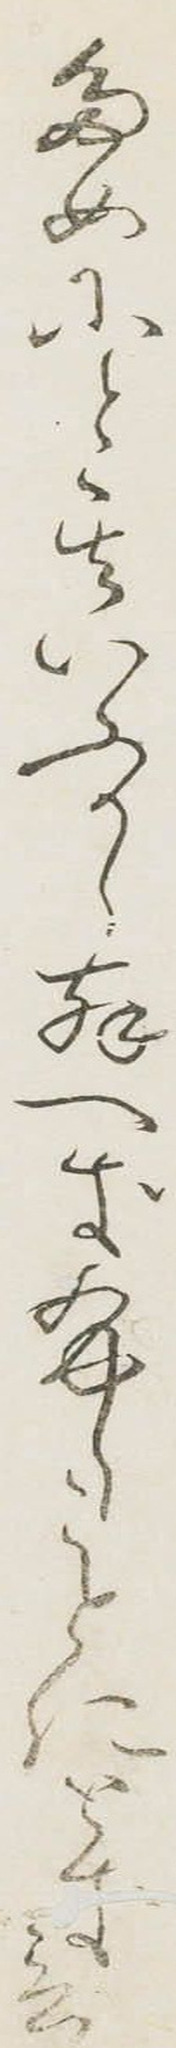ためにと其いふかし舞へきふしことにとき言
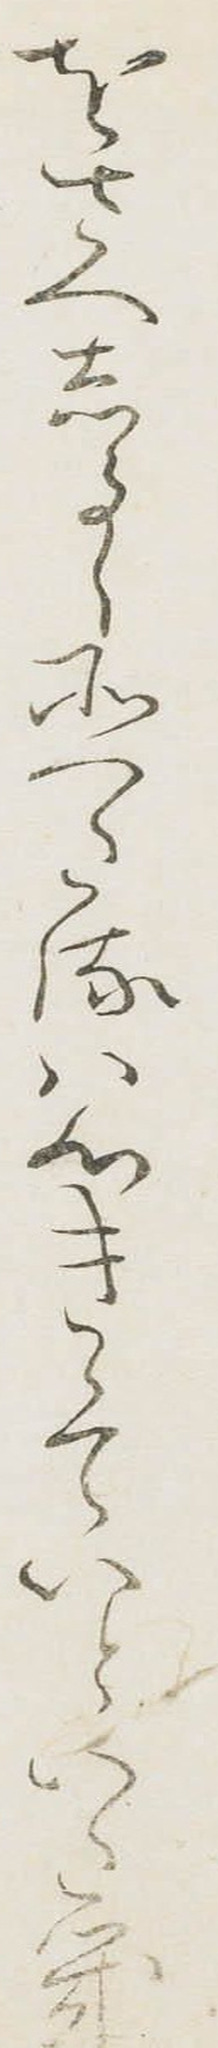をさへしるしそへたるは心きゝていといたき
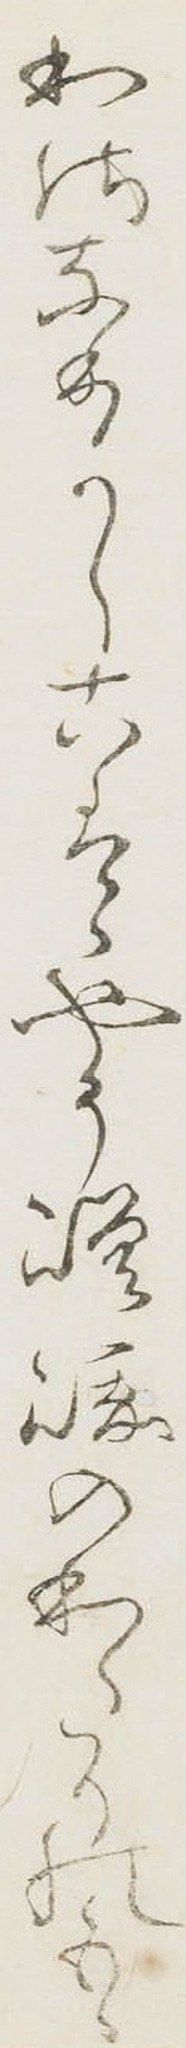わさなりかしこはゝやう嵯峨のわたりのもゝ
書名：源氏百人一首
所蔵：東京学芸大学教育コンテンツアーカイブ
